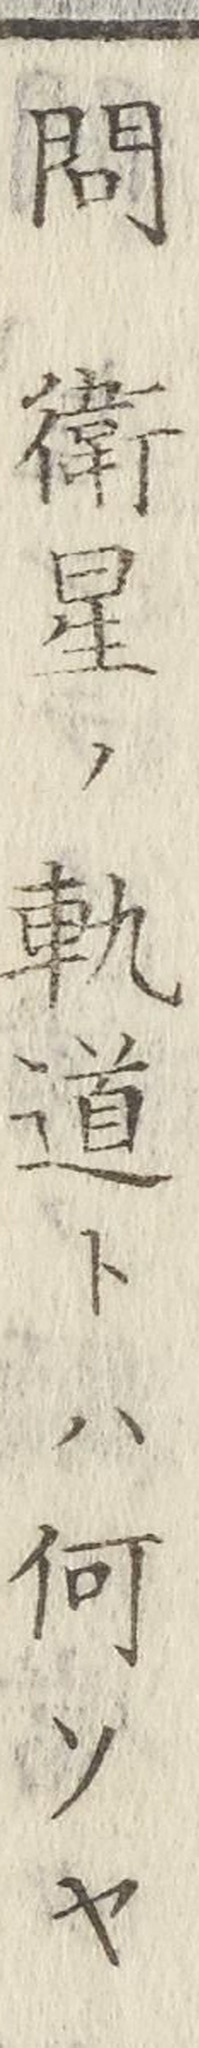問衛星ノ軌道トハ何ソヤ
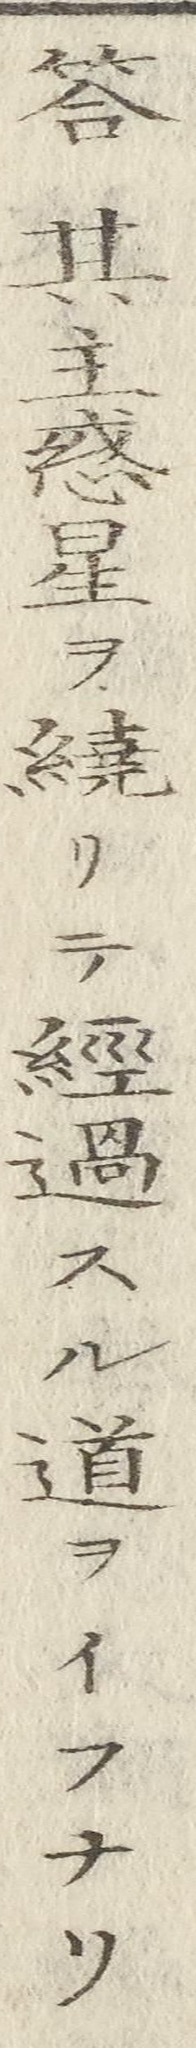答其主惑星ヲ繞リテ経過スル道ヲイフナリ
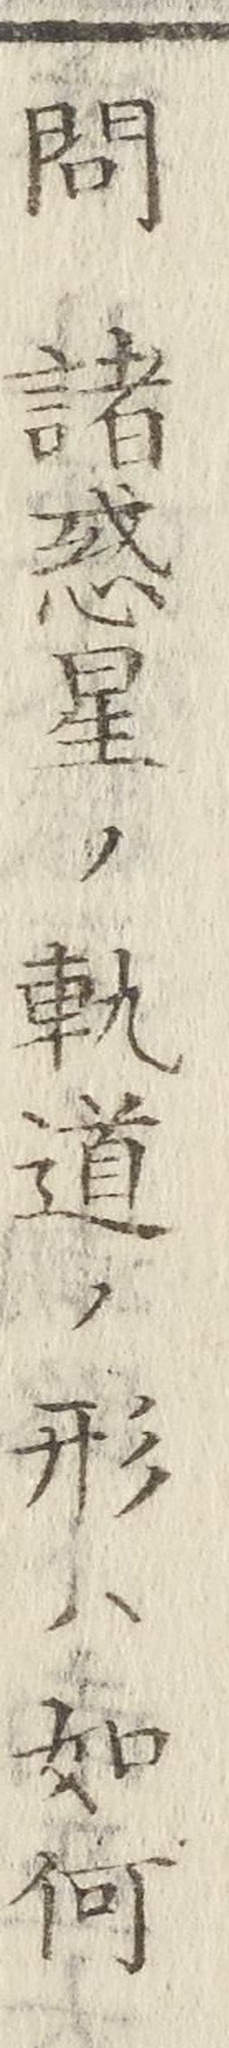問諸惑星ノ軌道ノ形ハ如何
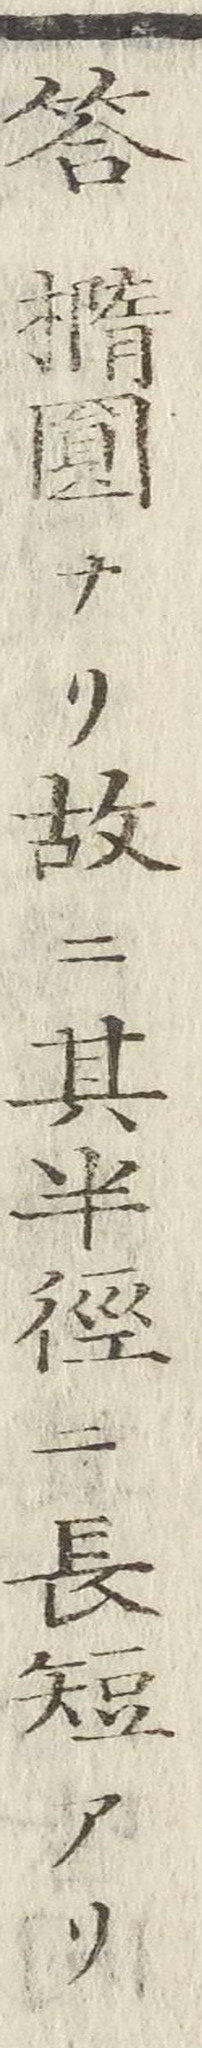答楕円ナリ故ニ其半径ニ長短アリ
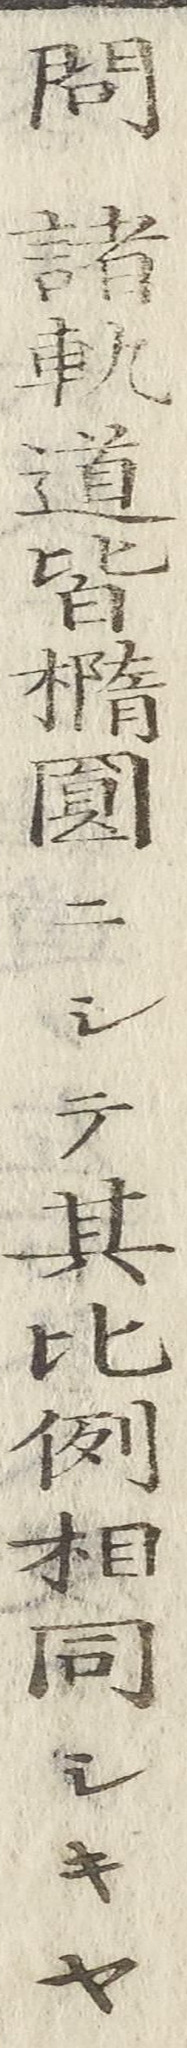問諸軌道皆楕円ニシテ其比例相同シキヤ
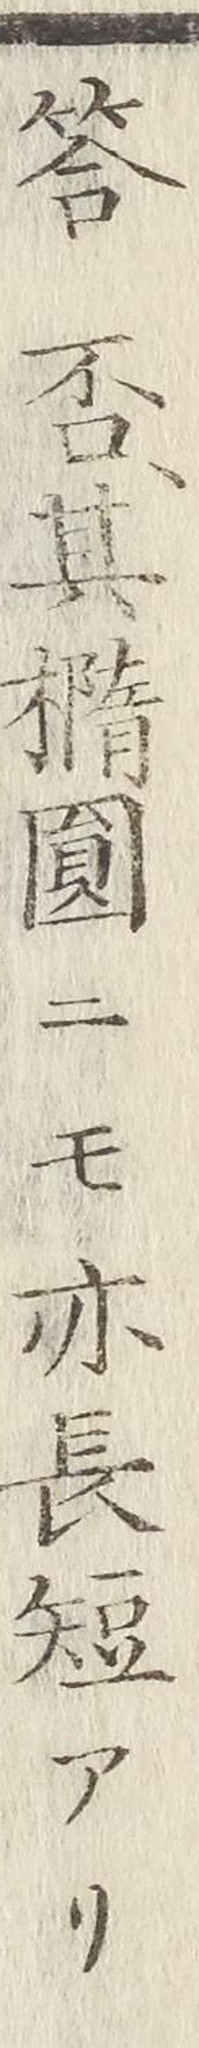答否、其楕円ニモ亦長短アリ
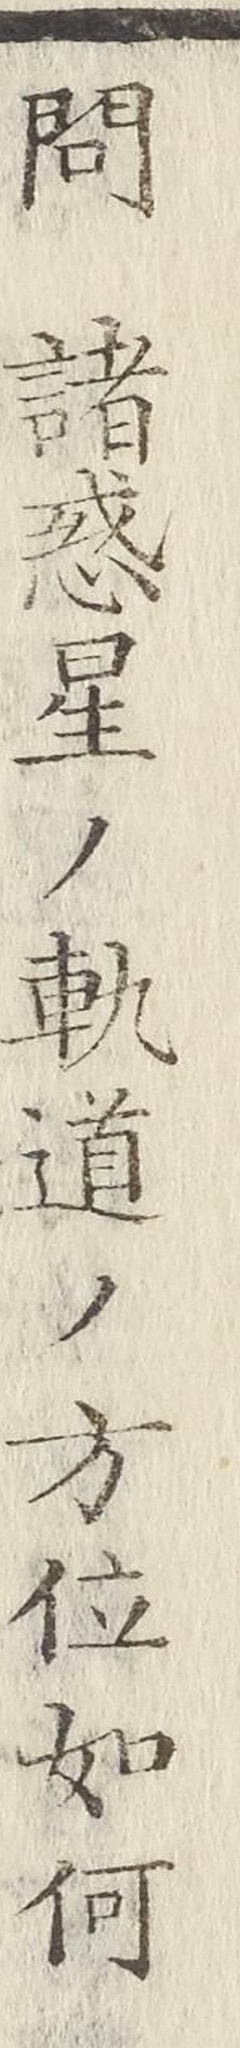問諸惑星ノ軌道ノ方位如何
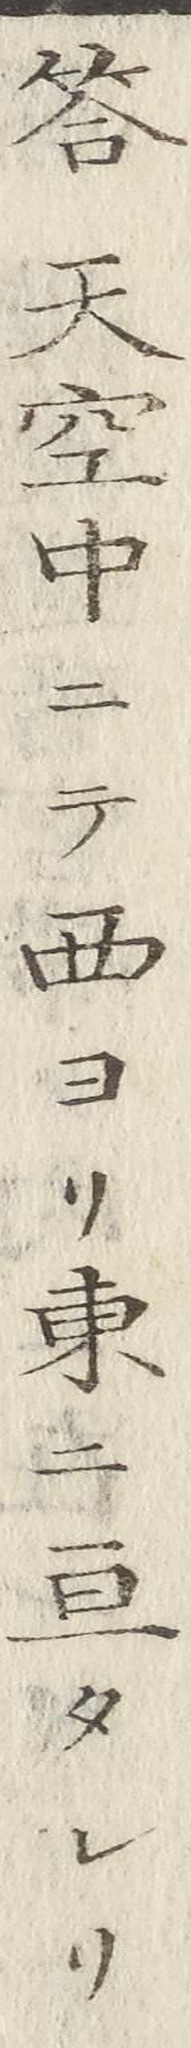答天空中ニテ西ヨリ東二亘タレリ
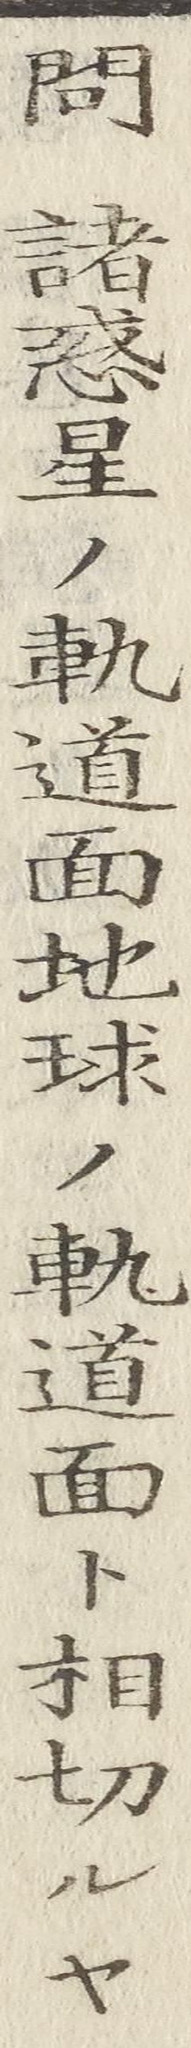問諸惑星ノ軌道面地球ノ軌道面ト相切ルヤ
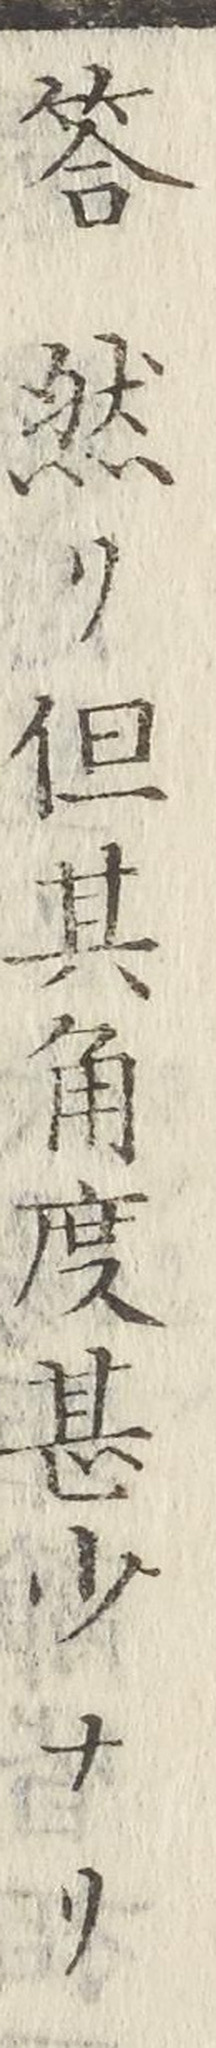答然リ但其角度甚少ナリ
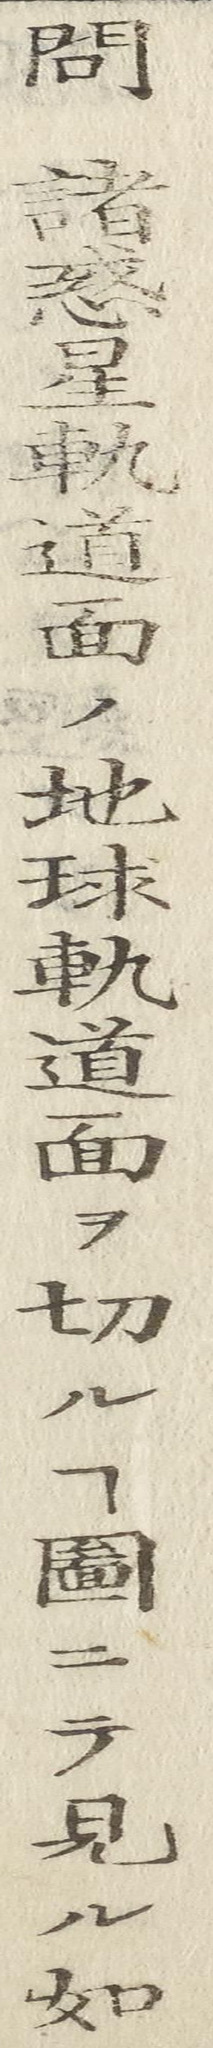問諸惑星軌道面ノ地球軌道面ヲ切ルコト図ニテ見ル如
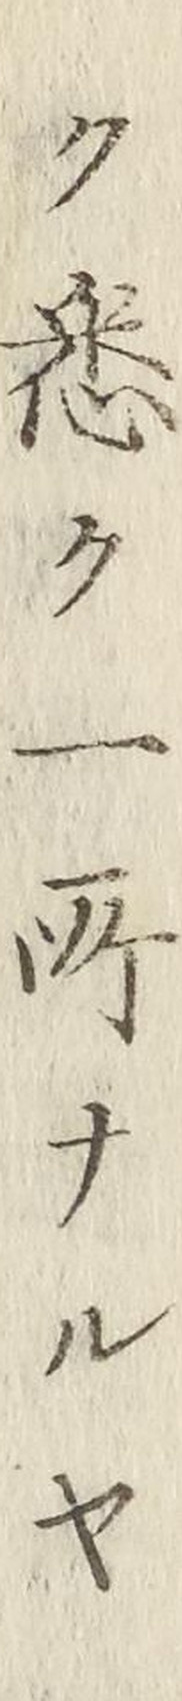ク悉ク一所ナルヤ
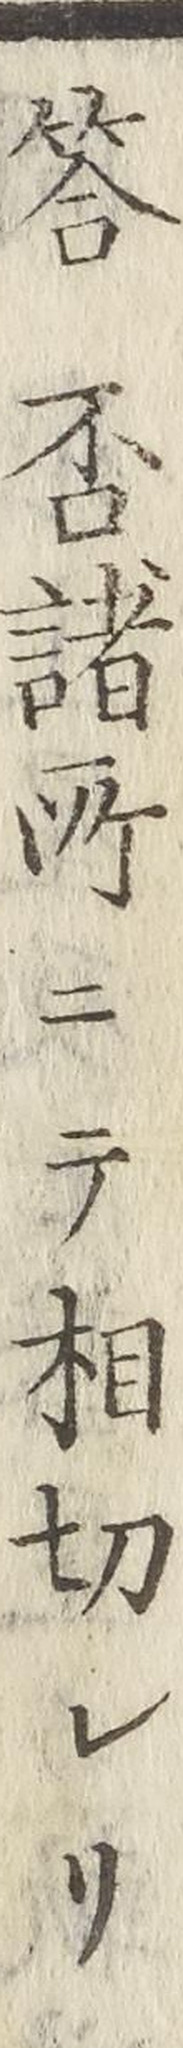答否諸所ニテ相切レリ

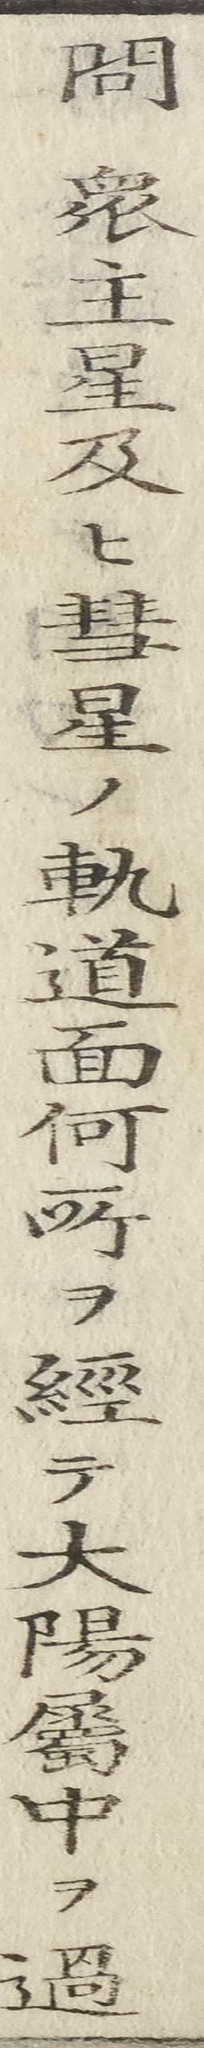問衆主星及ヒ彗星ノ軌道面何所ヲ経テ大陽属中ヲ過
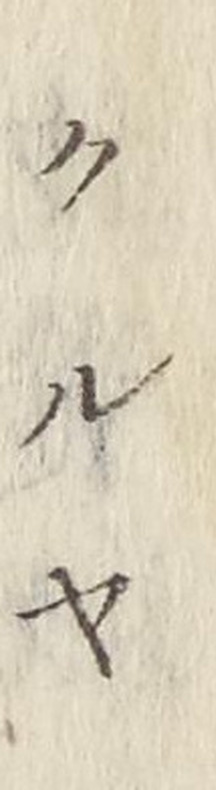クルヤ
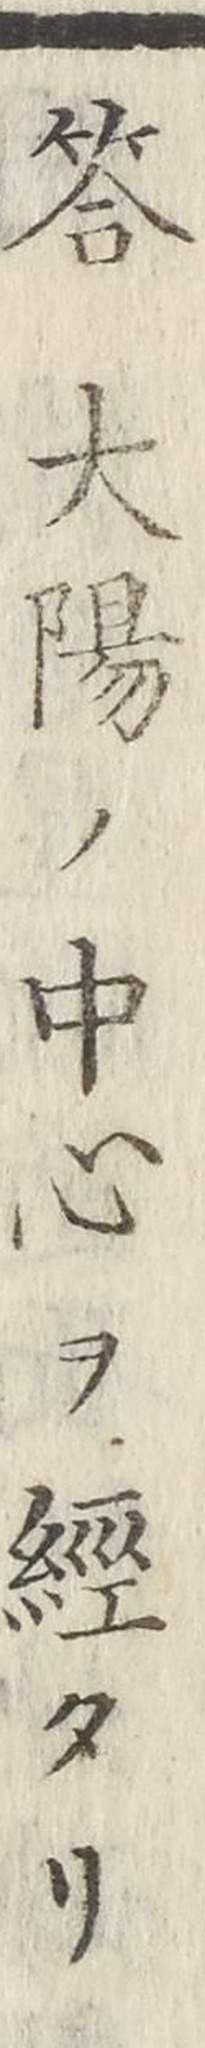答大陽ノ中心ヲ経タリ
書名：星学圖説　下
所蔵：東京大学地震研究所図書室 Earthquake Research Institute Library, The University of Tokyo, JAPAN
